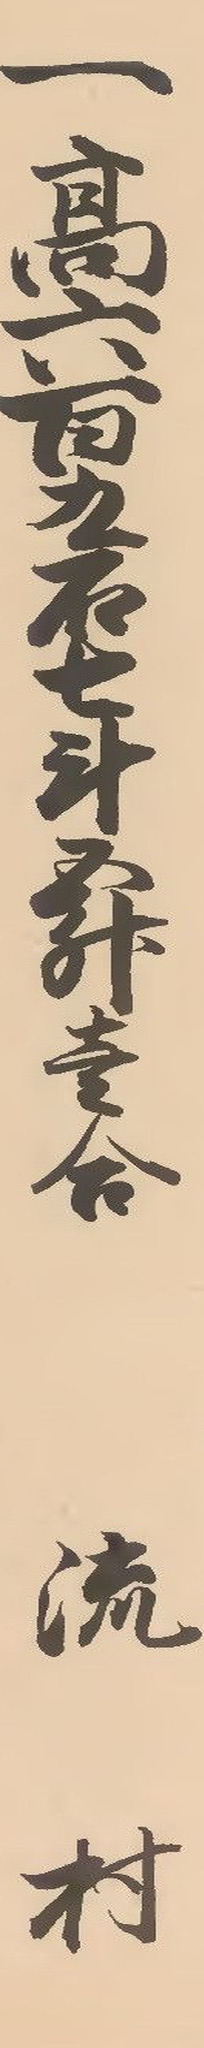一高六百九石七斗五升壱合流村
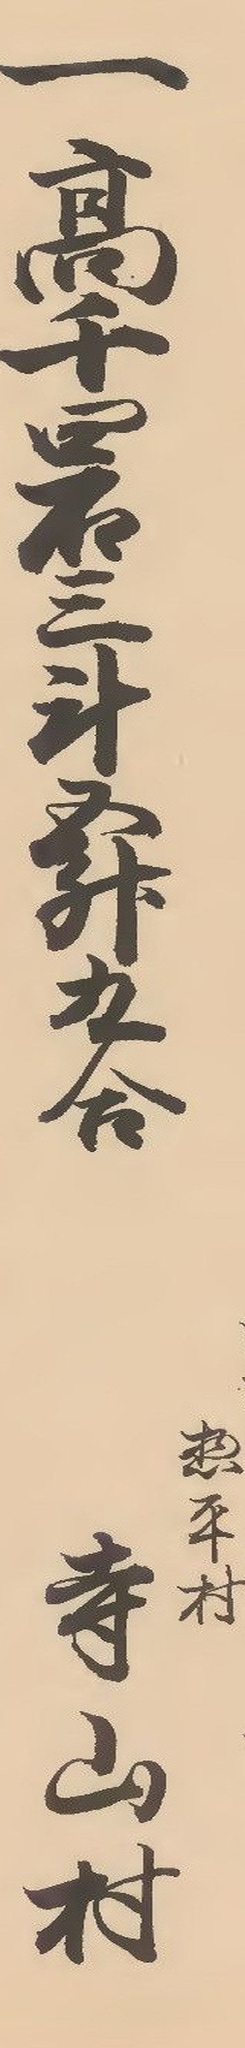一高千四石三斗五升九合寺山村
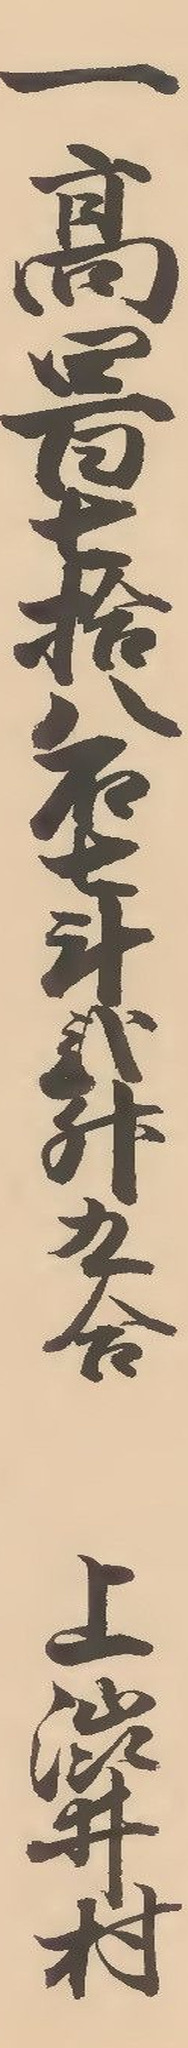一高四百七拾八石七斗弐升九合上渋井村
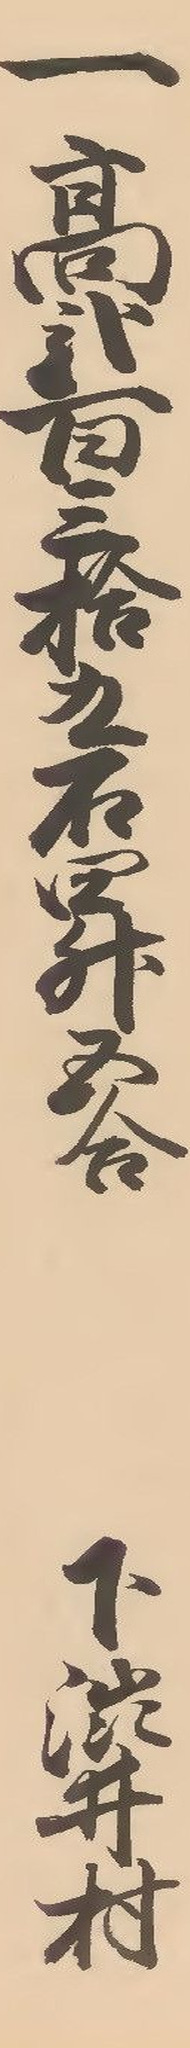一高弐百三拾九石四升五合下渋井村

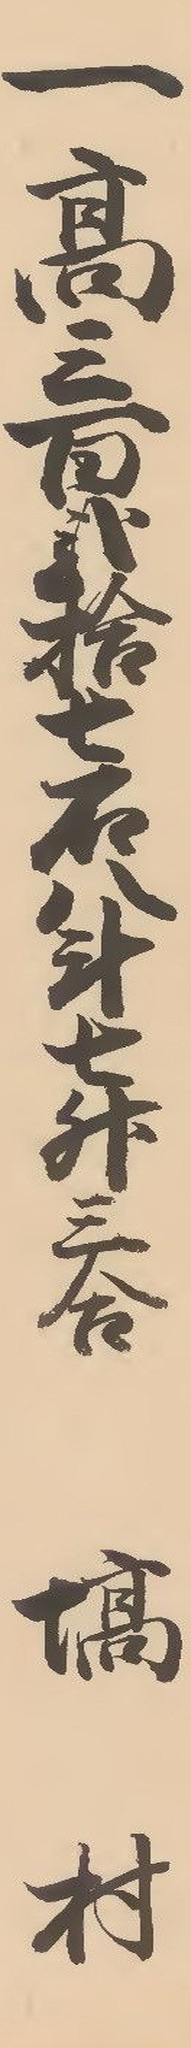一高三百弐拾七石八斗七升三合塙村
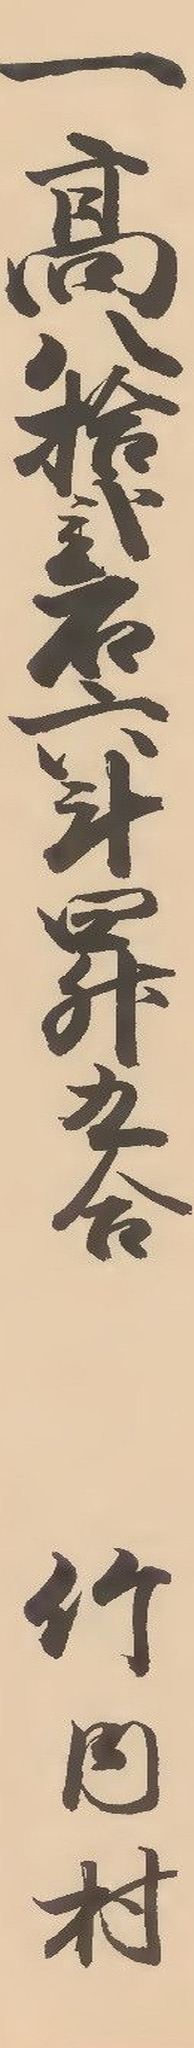一高八拾弐石六斗四升九合竹内村
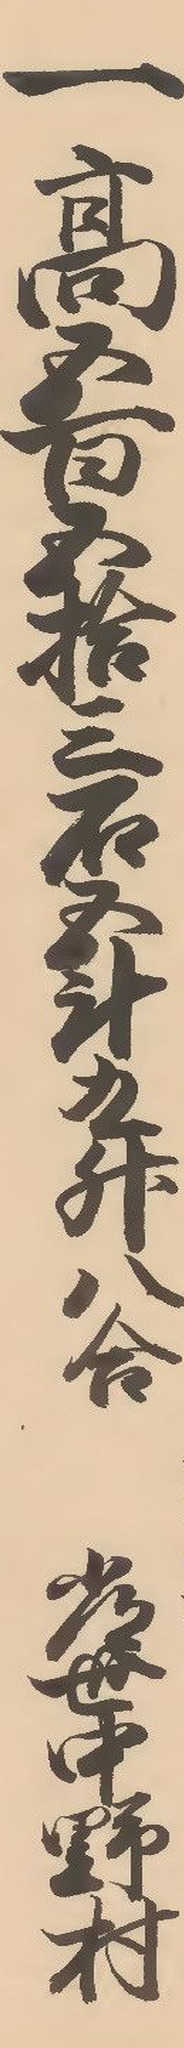一高五百五拾三石五斗九升八合常世中野村
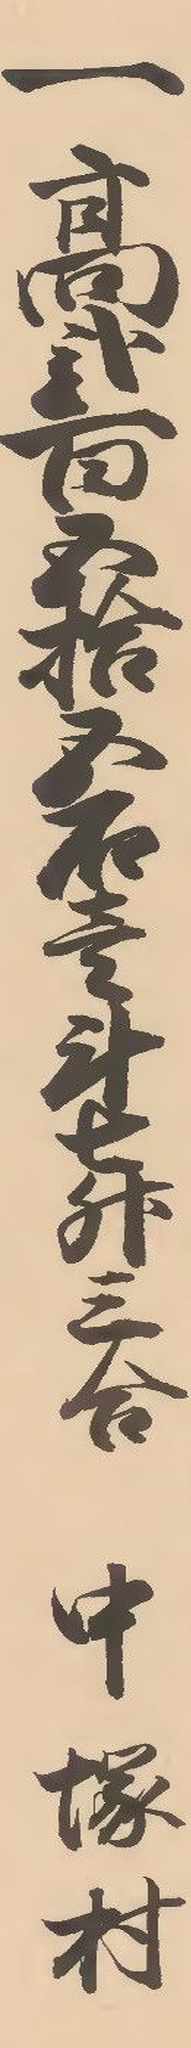一高弐百五拾五石壱斗七升三合中塚村
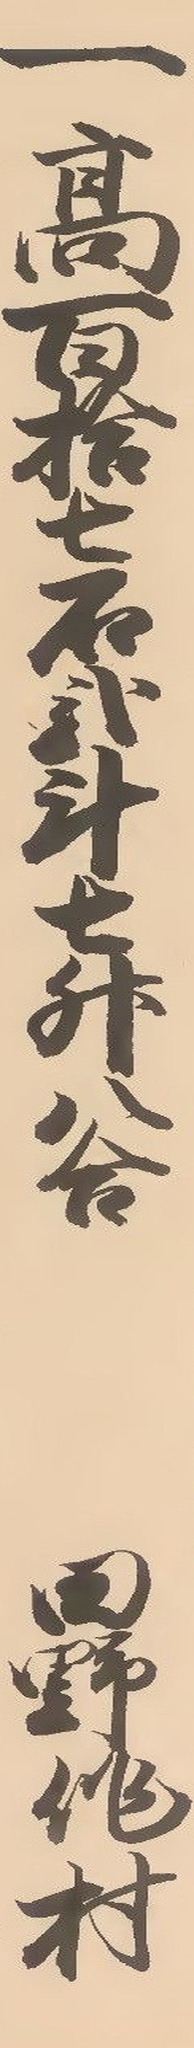一高百拾七石弐斗七升八合田野作村
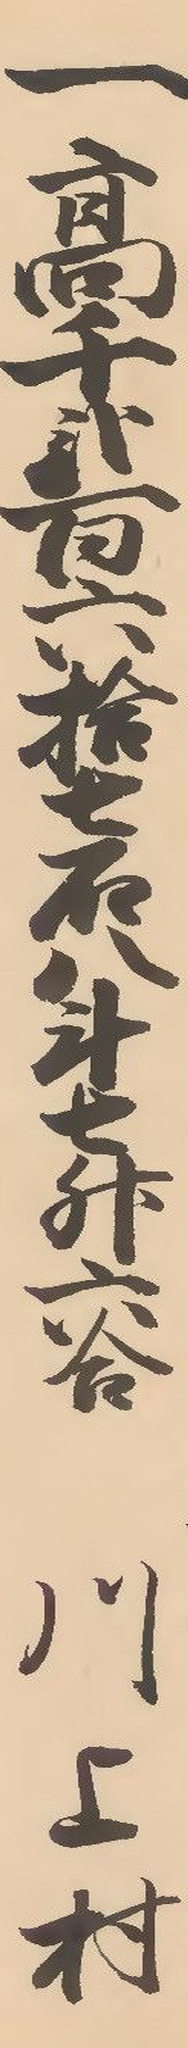一高千弐百六拾七石八斗七升六合川上村
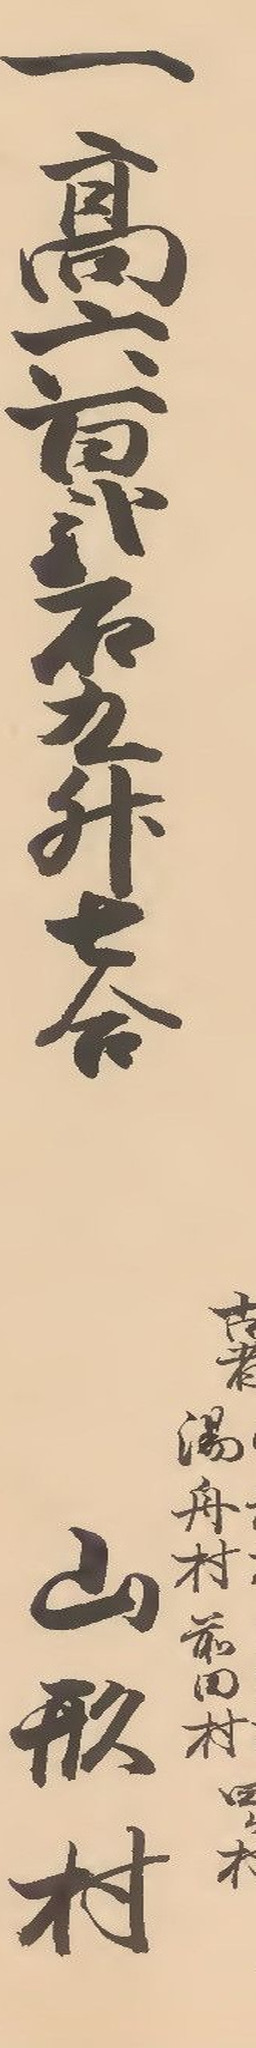一高六百弐石九升七合山形村
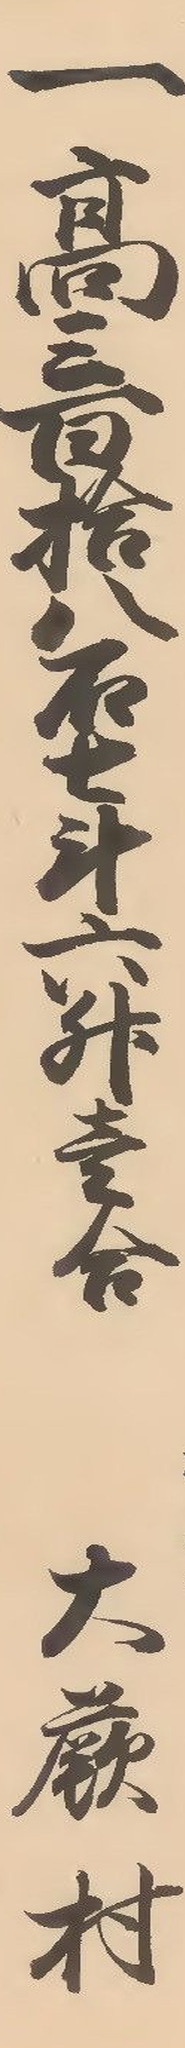一高三百拾八石七斗六升壱合大蕨村

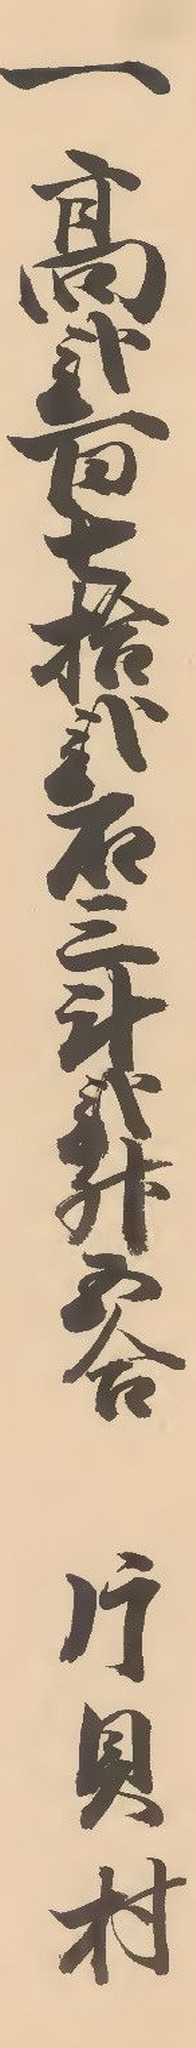一高弐百七拾弐石三斗弐升五合片貝村
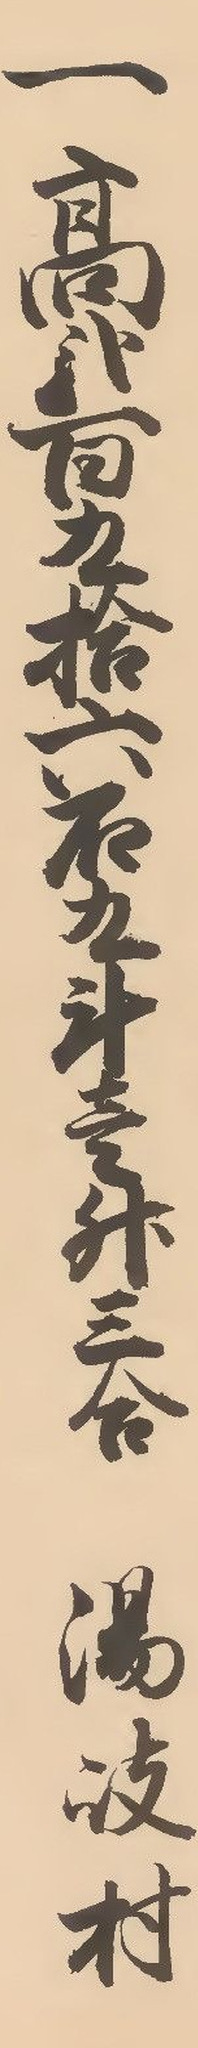一高弐百九拾六石九斗壱升三合湯岐村
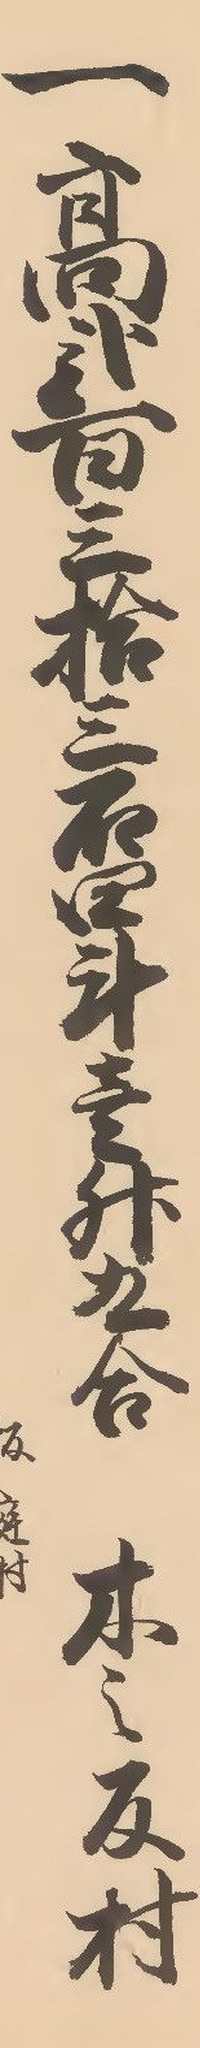一高弐百三拾三石四斗壱升九合木之反村
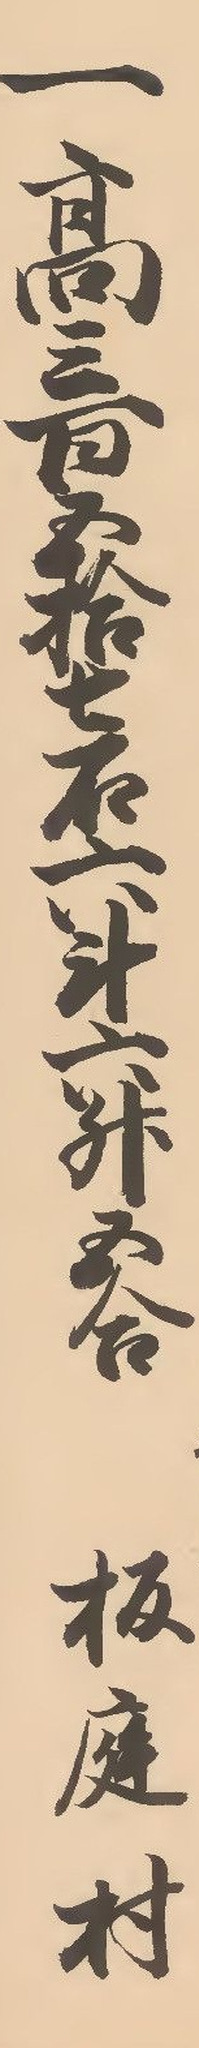一高三百五拾七石六斗六升五合板庭村
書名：陸奥国郷帳　３
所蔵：国立公文書館 National Archives of Japan
